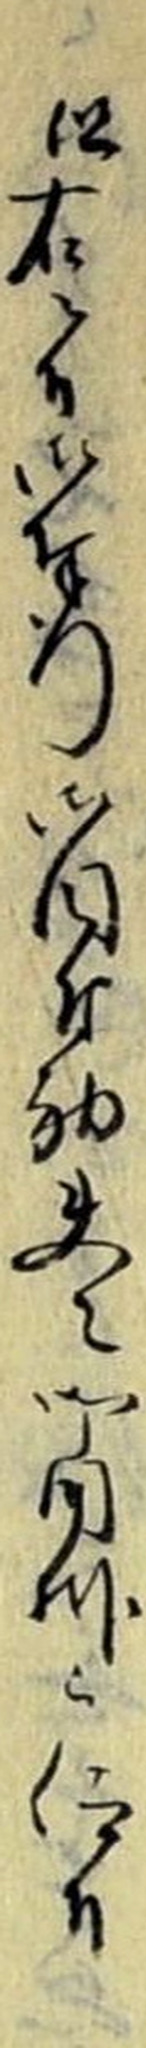但右に付御奉行御目付初夫々御用掛被仰付
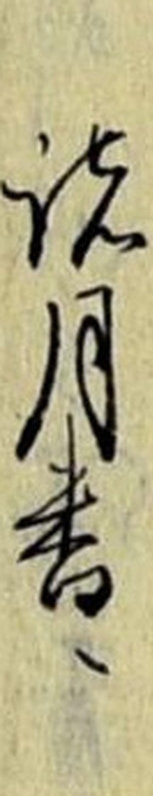諸月番へ
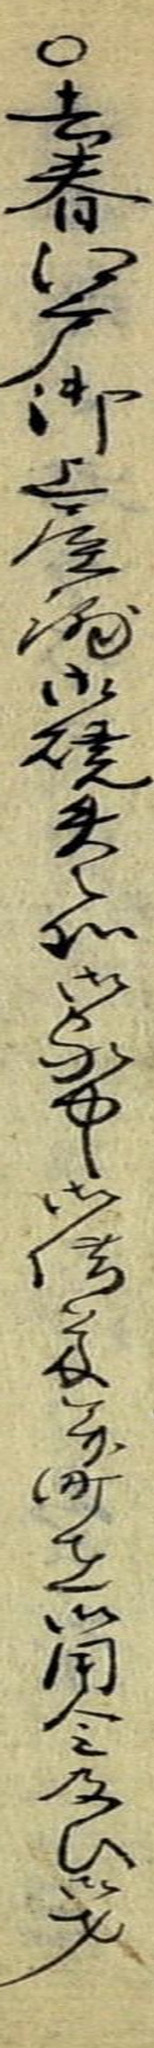○去春江戸御上屋鋪御焼失之処御家中御借米并町在御用金及び御才
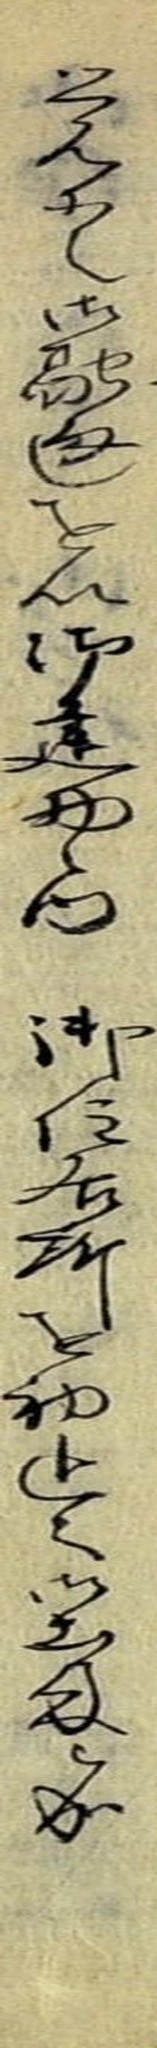覚等之御融通を以御建物之内御住居所を初追々御出来被成
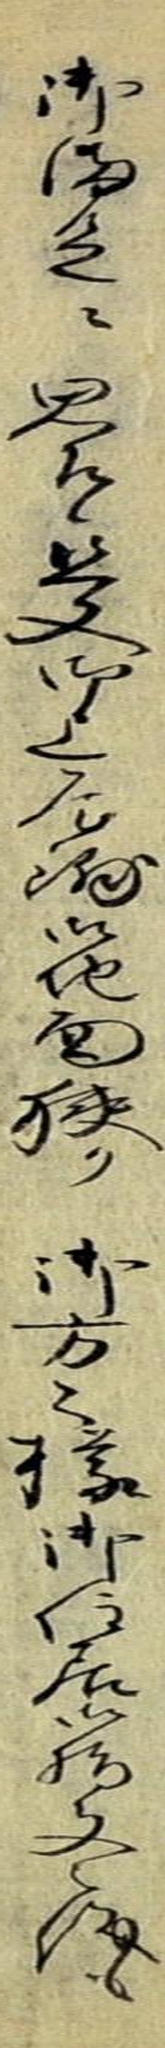御満足被思召候且又御上屋鋪御地面狭り御方々様御住居御指支候儀も
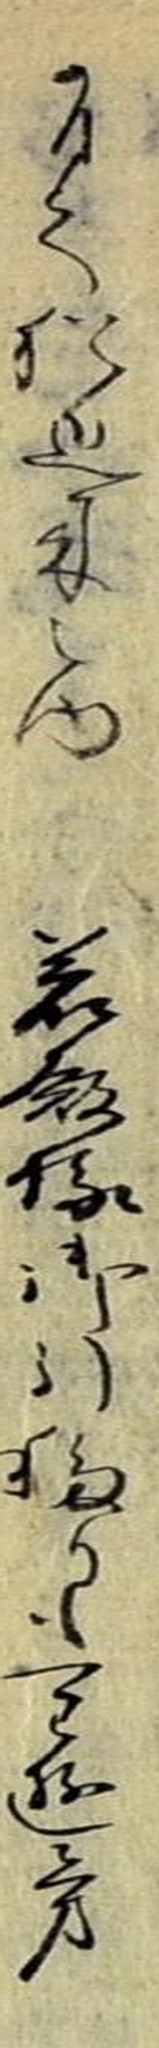有之猶近来之内若殿様御引移りも可被遊旁
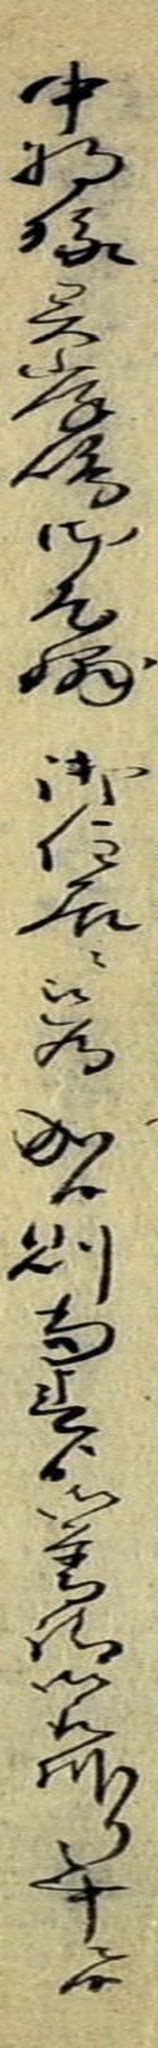中将様霊厳嶋御屋鋪御住居に被為成候則当春ゟ御普請御取掛り候事に候
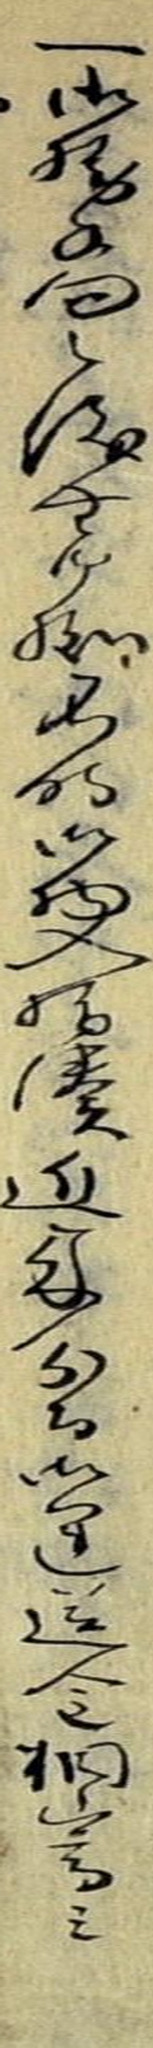一御勝手向之儀無御拠不時御物入指湊近来分而御運送金相嵩ミ
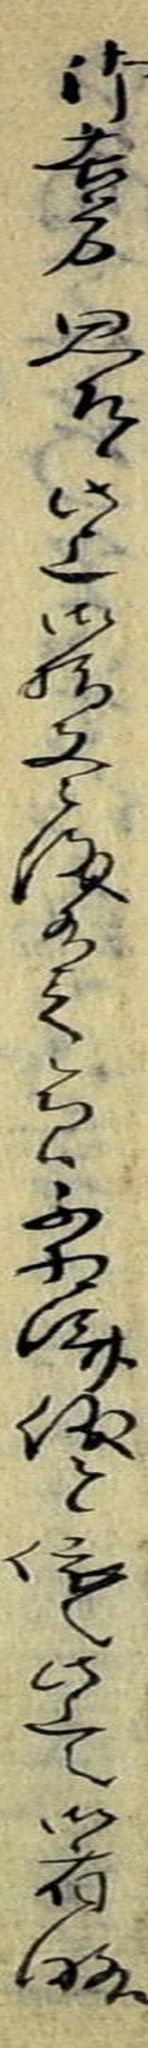御苦労思召候此上御指支之儀有之候而は不相済儀に候依之此上之御省略
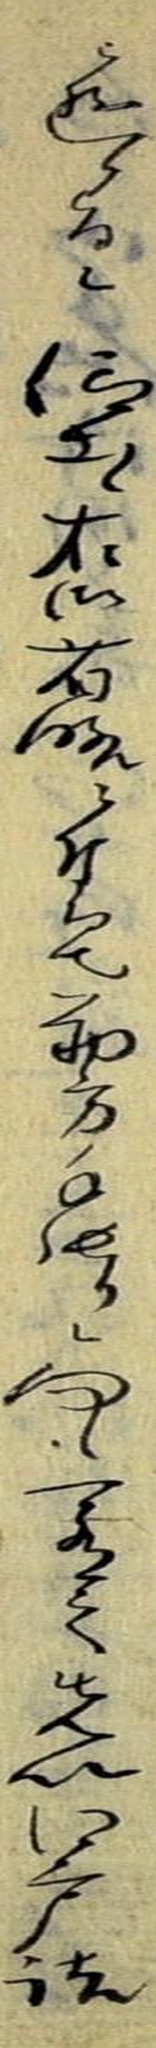被遊候旨被仰出候右御省略に付而は勤方手張り候向も可有之先以江戸詰
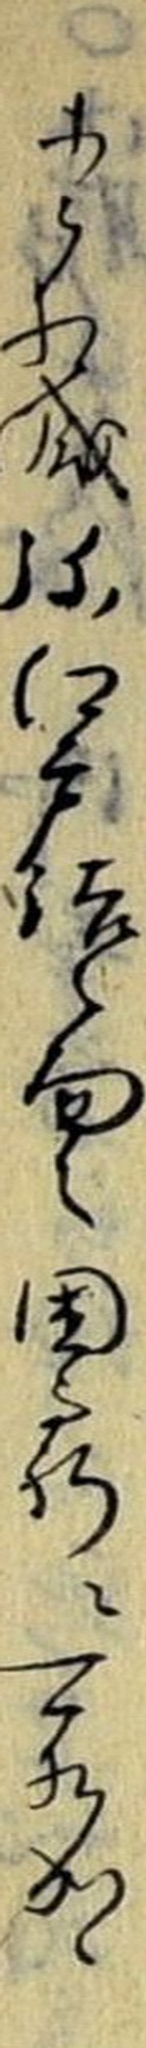等被相減弥江戸詰之向之困窮に可相成候
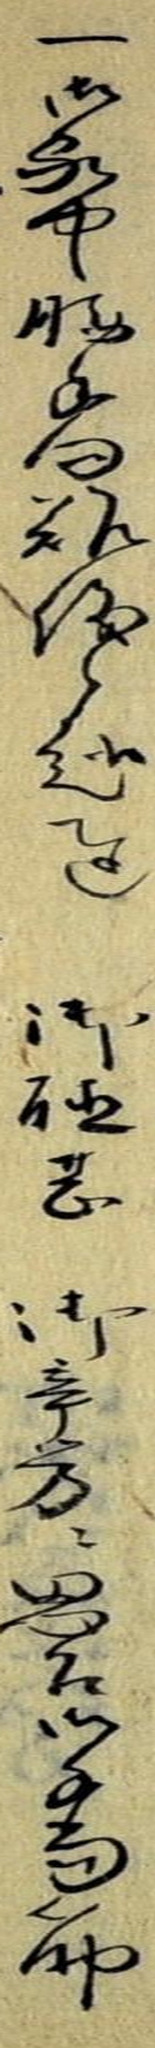一御家中勝手向難儀之趣達御聴甚御辛労被思召御手当筋
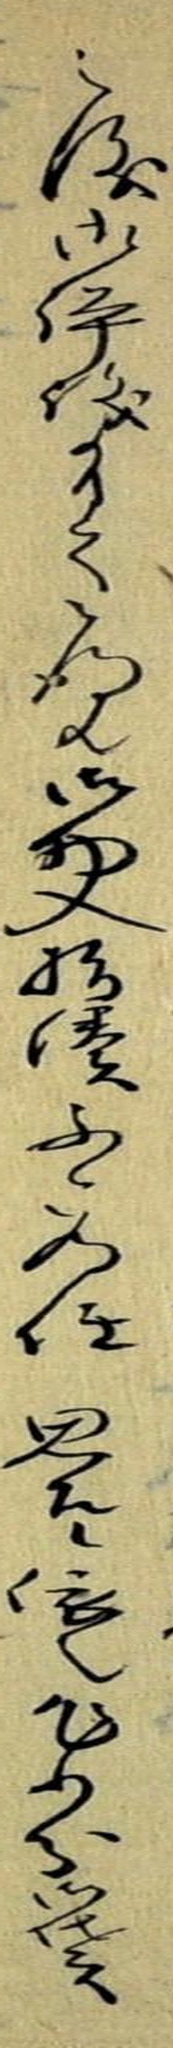之儀御評議有之候得共御物入指湊不被為任思召候依之乍少分御貸
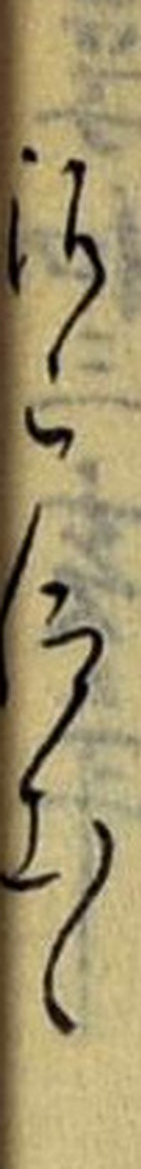銀被仰出候
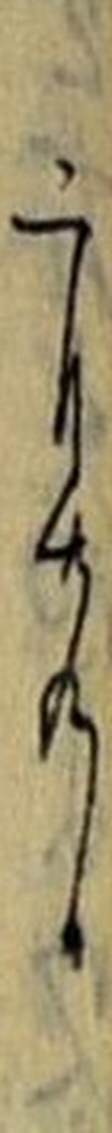二月廿九日
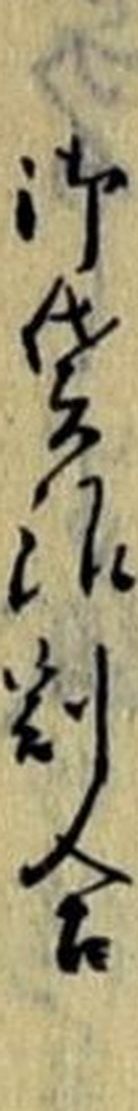御貸銀割合
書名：命令之部 四
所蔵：福井県文書館 Fukui Prefectural Archives
